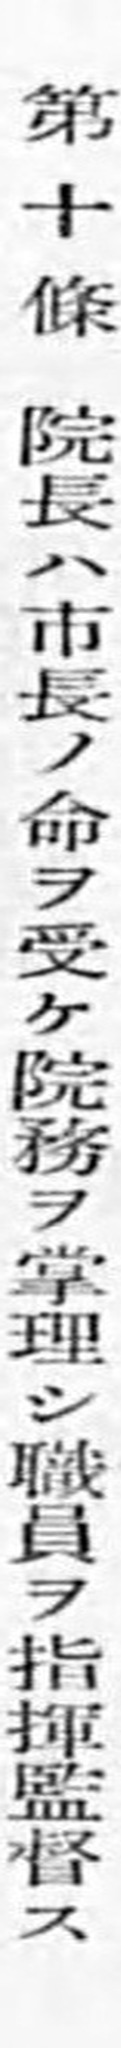第十条院長ハ市長ノ命ヲ受ケ院務ヲ掌理シ職員ヲ指揮監督ス
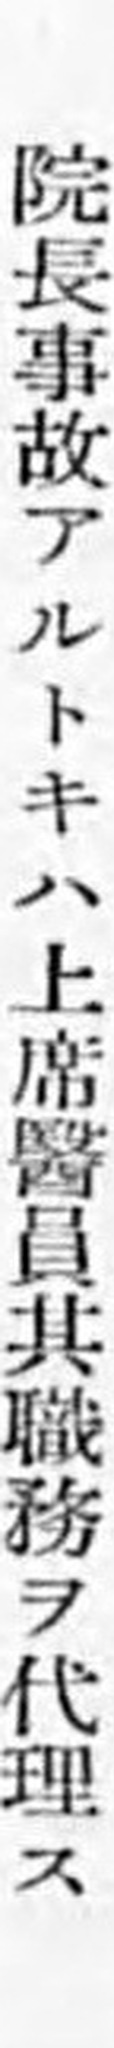院長事故アルトキハ上席医員其職務ヲ代理ス
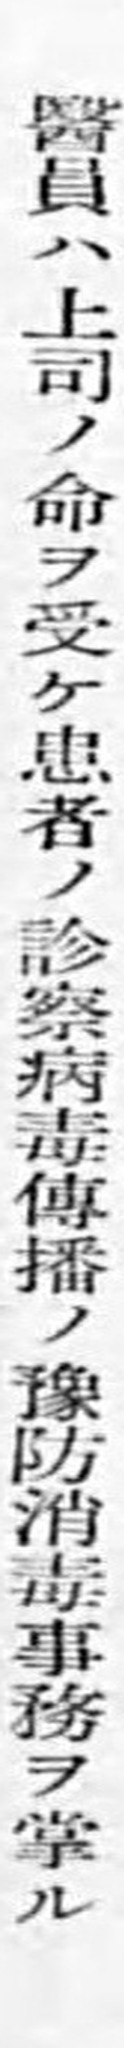医員ハ上司ノ命ヲ受ケ患者ノ診察病毒伝播ノ予防消毒事務ヲ掌ル
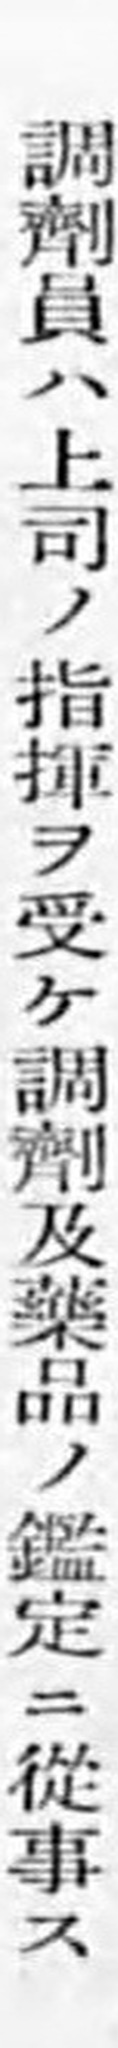調剤員ハ上司ノ指揮ヲ受ケ調剤及薬品ノ鑑定ニ従事ス
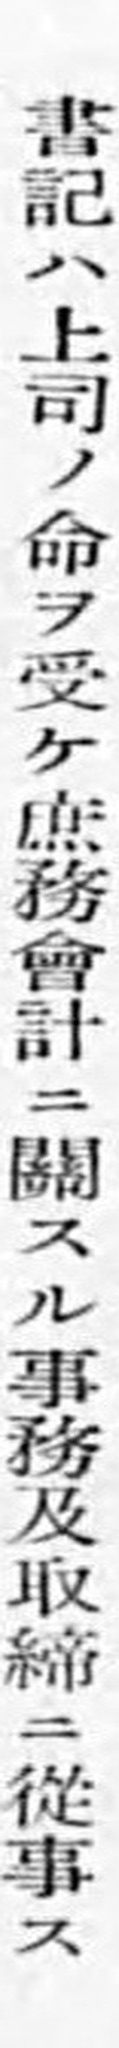書記ハ上司ノ命ヲ受ケ庶務会計ニ関スル事務及取締二従事ス
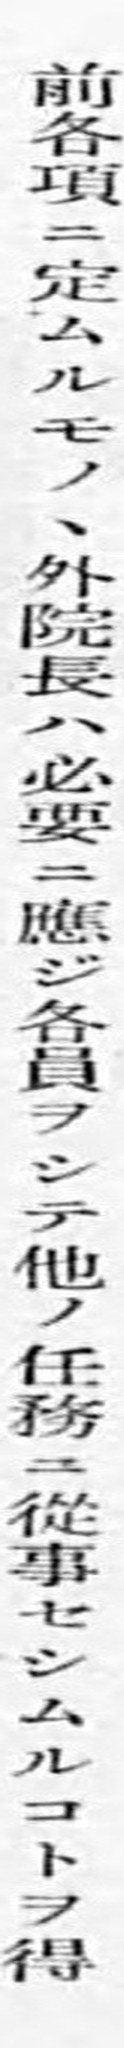前各項ニ定ムルモノヽ外院長ハ必要ニ応ジ各員ヲシテ他ノ任務ニ従事セシムルコトヲ得
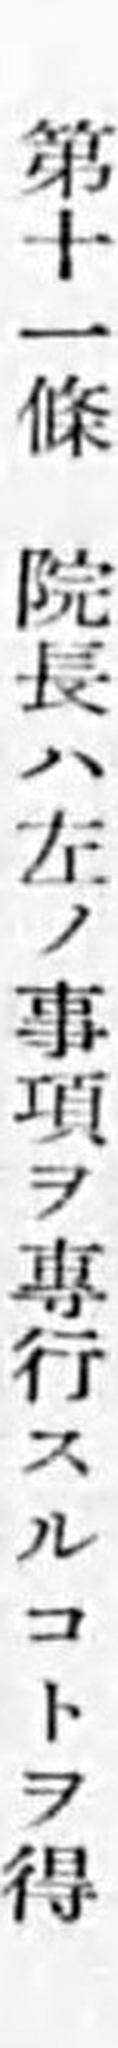第十一条院長ハ左ノ事項ヲ専行スルコトヲ得
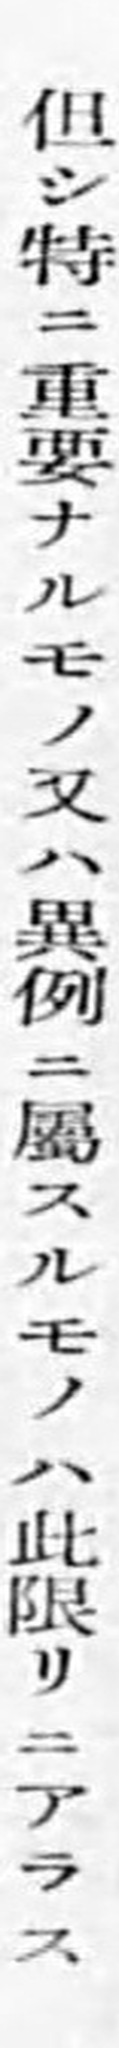但シ特ニ重要ナルモノ又ハ異例ニ属スルモノハ此限リニアラス
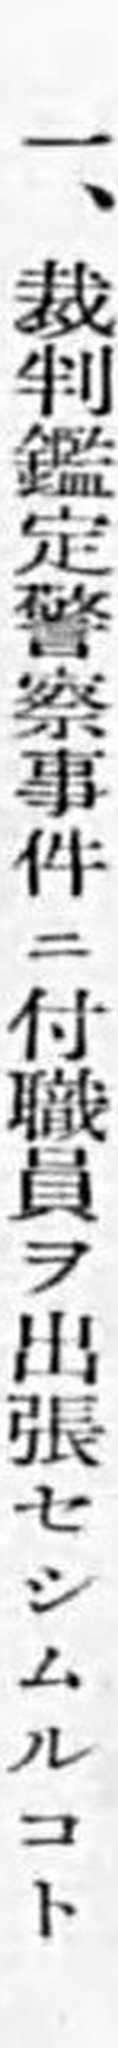一、裁判鑑定警察事件ニ付職員ヲ出張セシムルコト
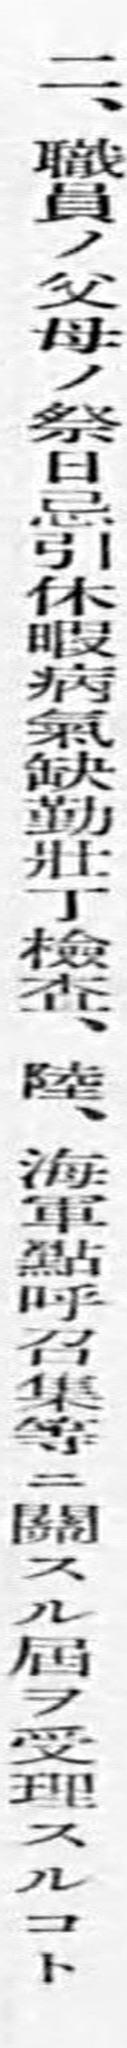二、職員ノ父母ノ祭日忌引休暇病気欠勤壮丁検査、陸、海軍点呼召集等ニ関スル届ヲ受理スルコト
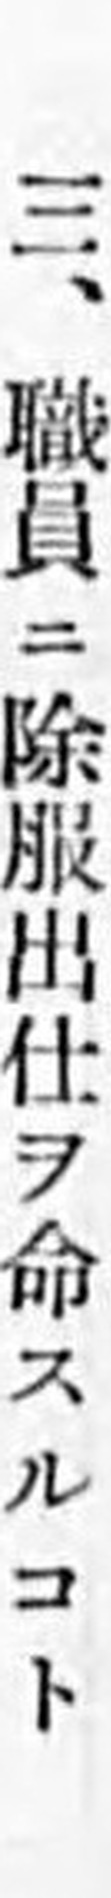三、職員ニ除服出仕ヲ命スルコト
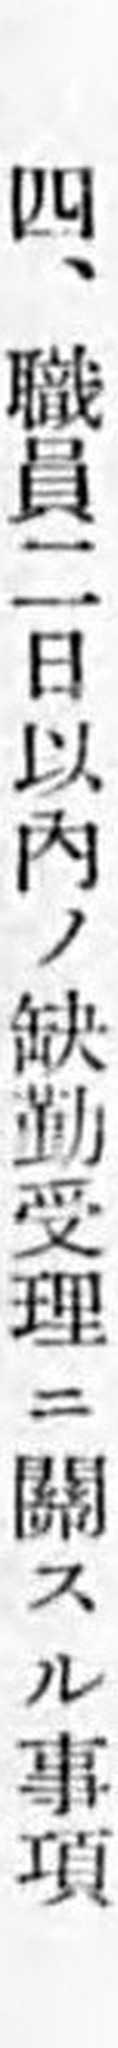四、職員二日以内ノ欠勤受理ニ関スル事項
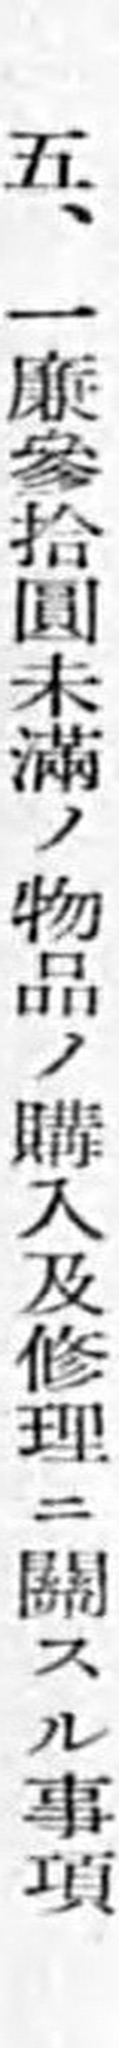五、一廉参拾円未満ノ物品ノ購入及修理ニ関スル事項
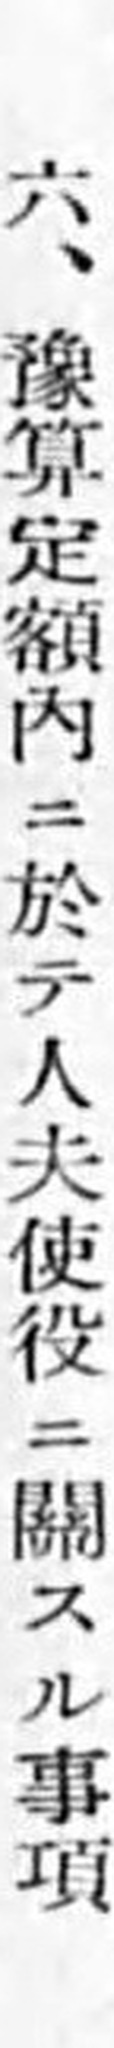六、予算定額内ニ於テ人夫使役ニ関スル事項
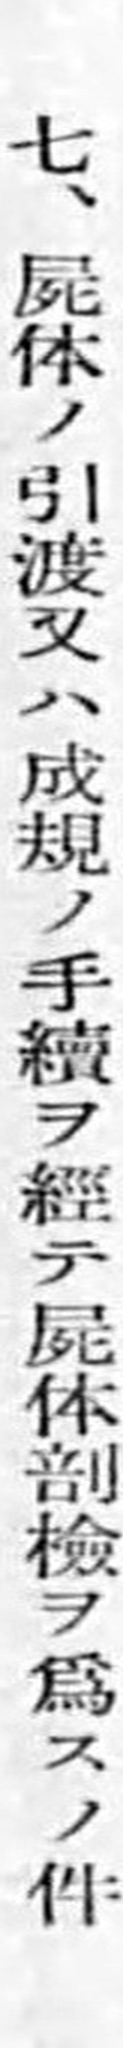七、屍体ノ引渡又ハ成規ノ手続ヲ経テ屍体剖検ヲ為スノ件
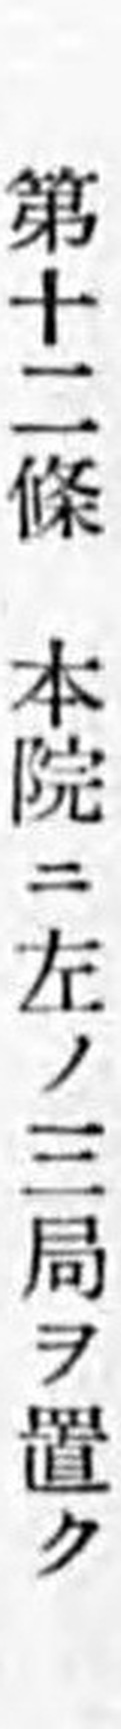第十二条本院ニ左ノ三局ヲ置ク
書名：豊橋市立高山病院年報. 昭和12年度
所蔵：国立国会図書館 National Diet Library, JAPAN
